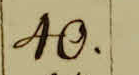40.
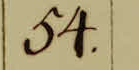54.
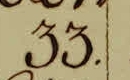33.
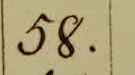58.
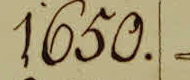1650.
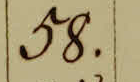58.
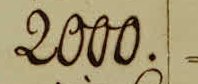2000.
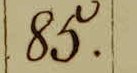85.
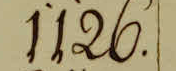1126.
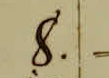8.
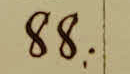88.
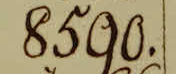8590.
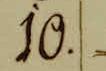10.
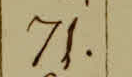71.
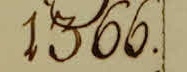1366.
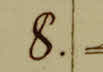8.
